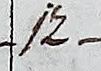12
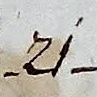21
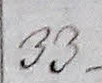33
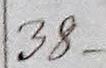38
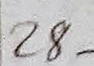28
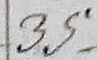35
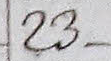23
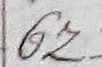62
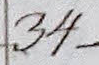34
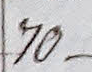70
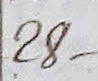28
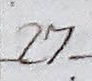27
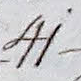41
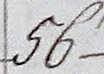56
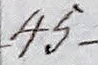45
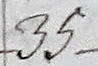35
